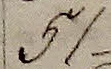51
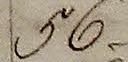56
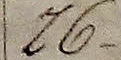26
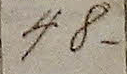48
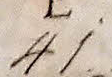41
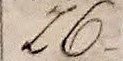26
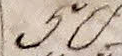50
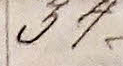34
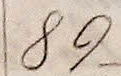89
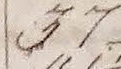37
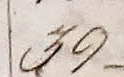39
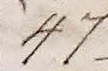47
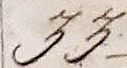33
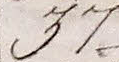37
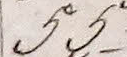55
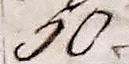50
